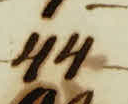44
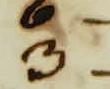3
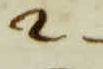2
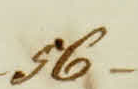56
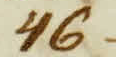46
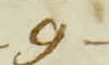9
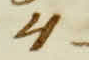4
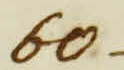60
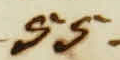55
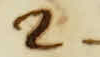2
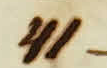41
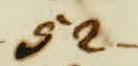52
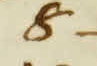8
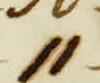11
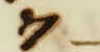7
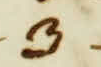3
